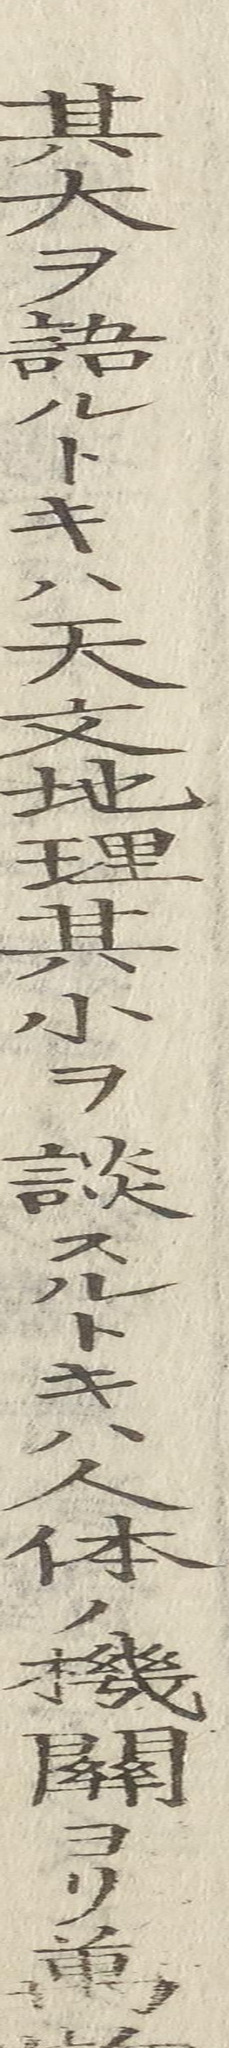其大ヲ語ルトキハ天文地理其小ヲ談スルトキハ人体ノ機関ヨリ万物

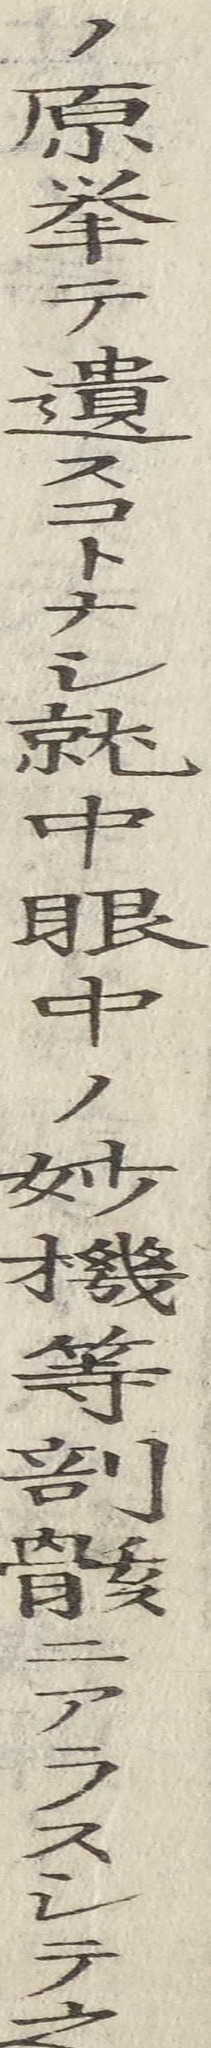ノ原挙テ遺スコトナシ就中眼中ノ妙機等剖骸ニアラスシテ之
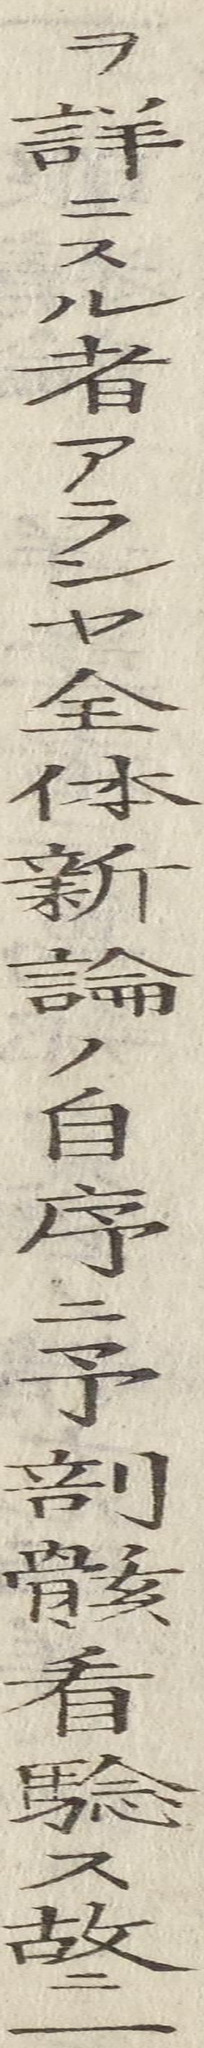ヲ詳ニスル者アランヤ全体新論ノ自序ニ予剖骸看騐ス故ニ一
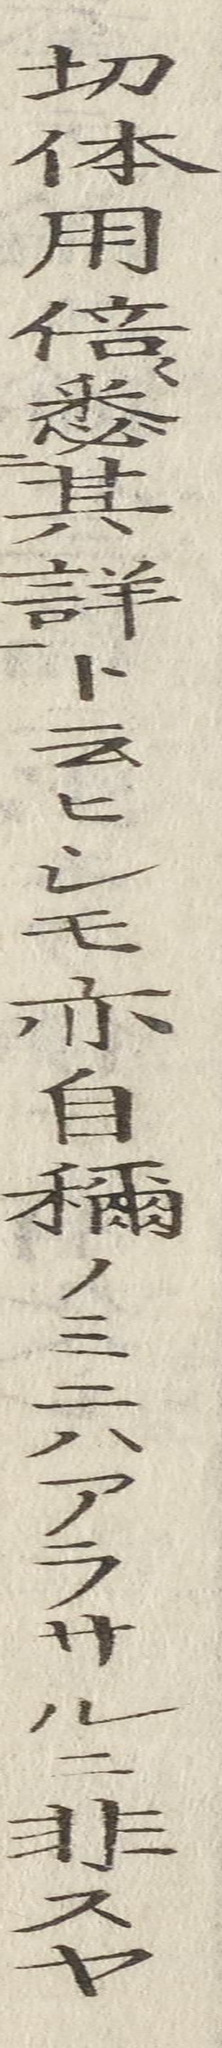切体用倍〱悉ニ其詳ト云ヒシモ亦自称ノミニハアラサルニ非スヤ
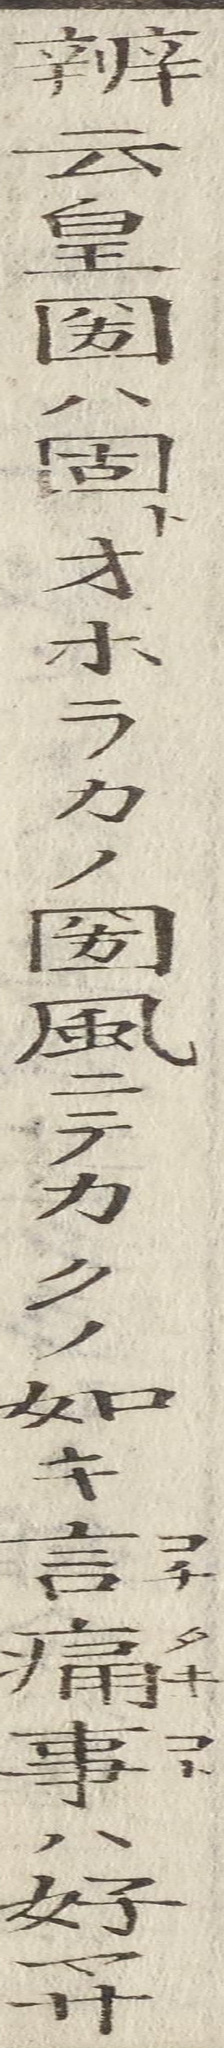弁云皇国ハ固国風ニテカクノ如キ言痛事ハ好マサ
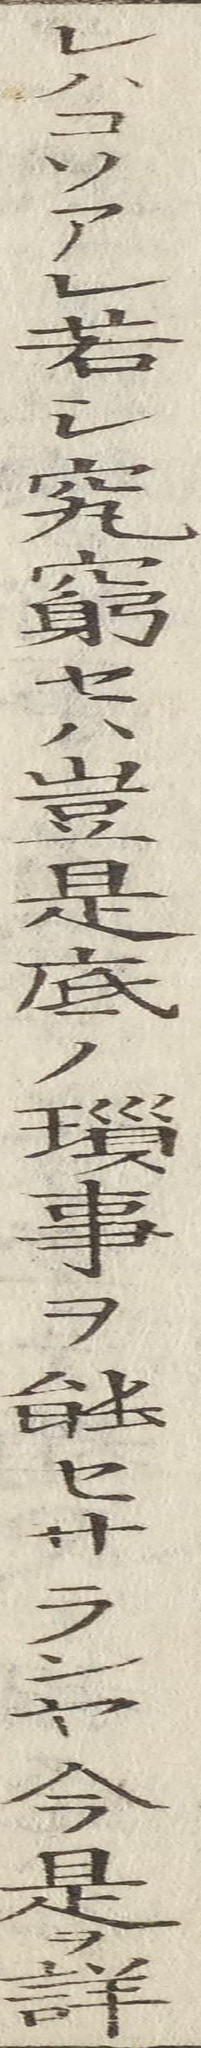レハコソアレ若シ究窮セハ豈是底ノ瑣事ヲ能セサランヤ今是ヲ詳
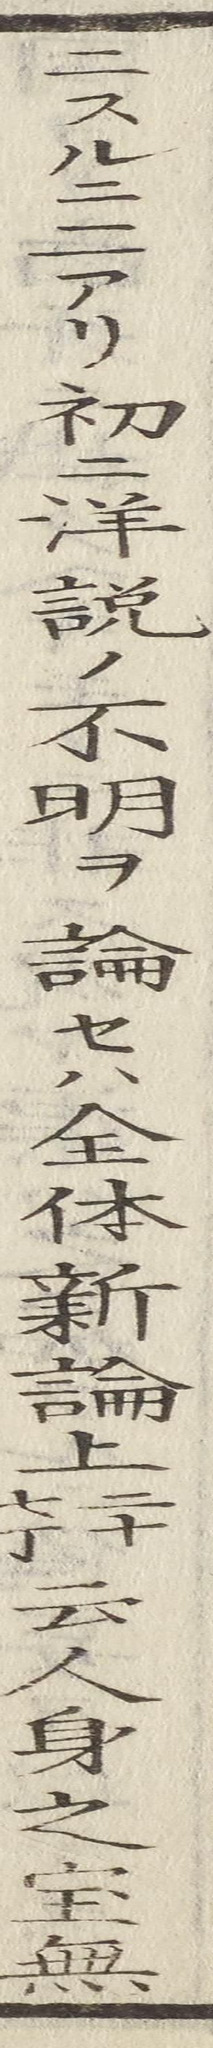ニスルニニアリ初ニ洋説ノ不明ヲ論セハ全体新論上二十七丁云人身之宝無
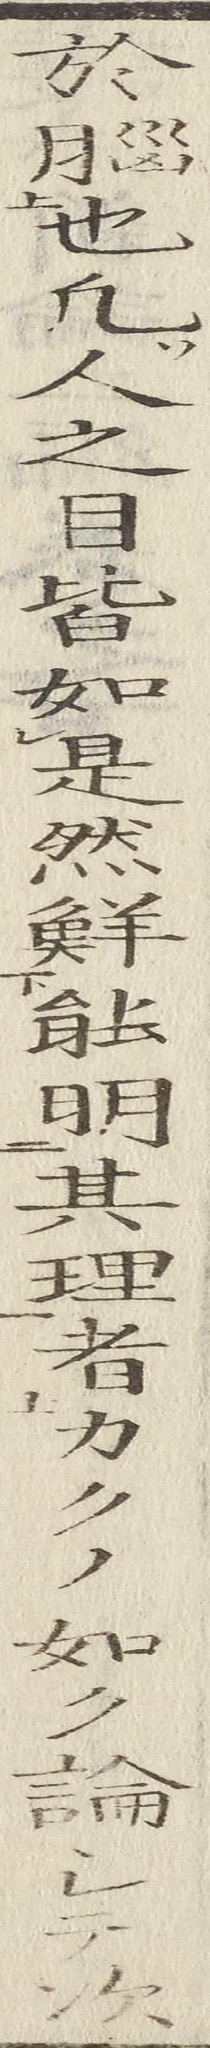於脳也凡人之目皆如是然鮮能明ニ其理者カクノ如ク論シテ次
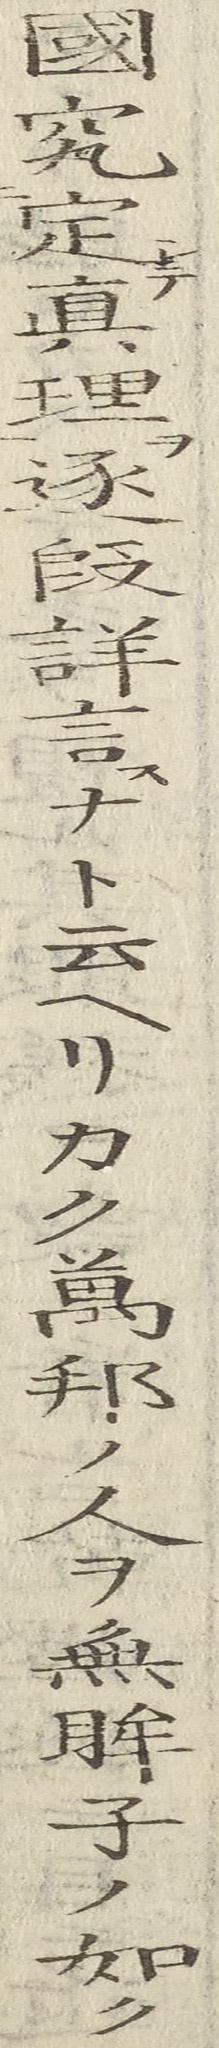国究ニ定真理遂仮詳言云ヘリカク万邦ノ人ヲ無眸子ノ如ク
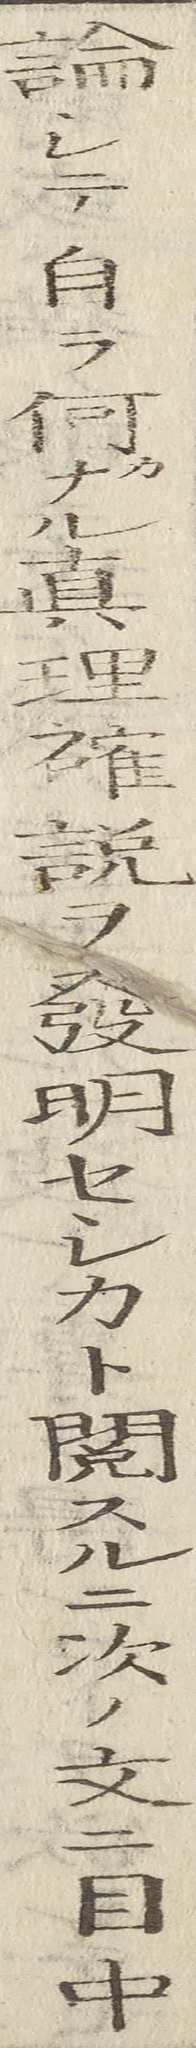論シテ自ラ何真理確説ヲ発明セシカト閲スルニ次ノ文ニ目中
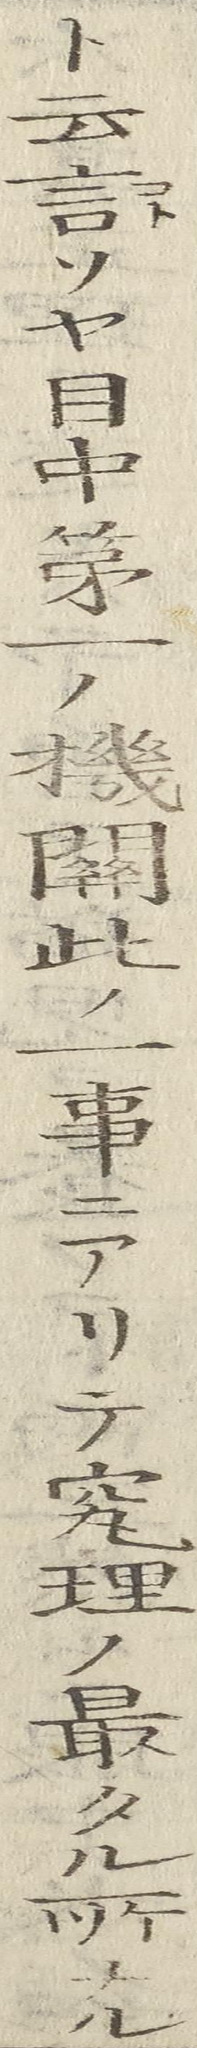ト云言ソヤ目中第一ノ機関此ノ一事ニアリテ究理ノ最タル所ナル
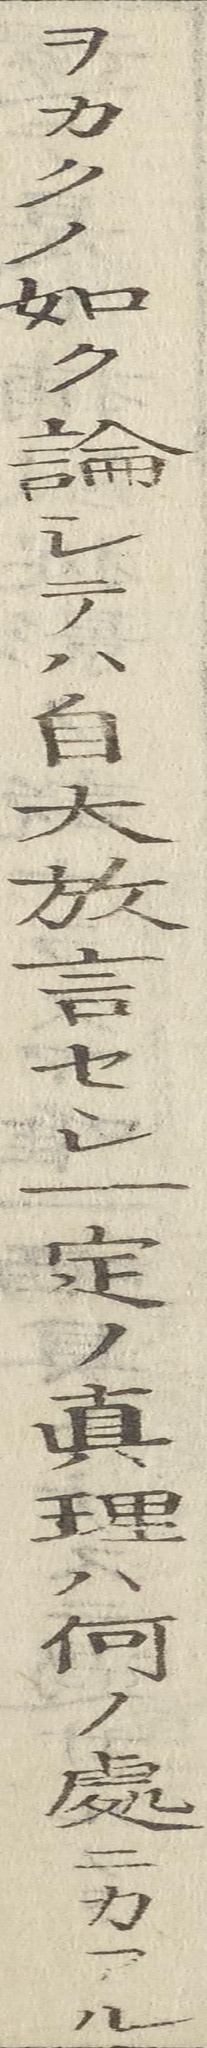ヲカクノ如ク論シテハ自大放言セシ一定ノ真理ハ何ノ処ニカアル

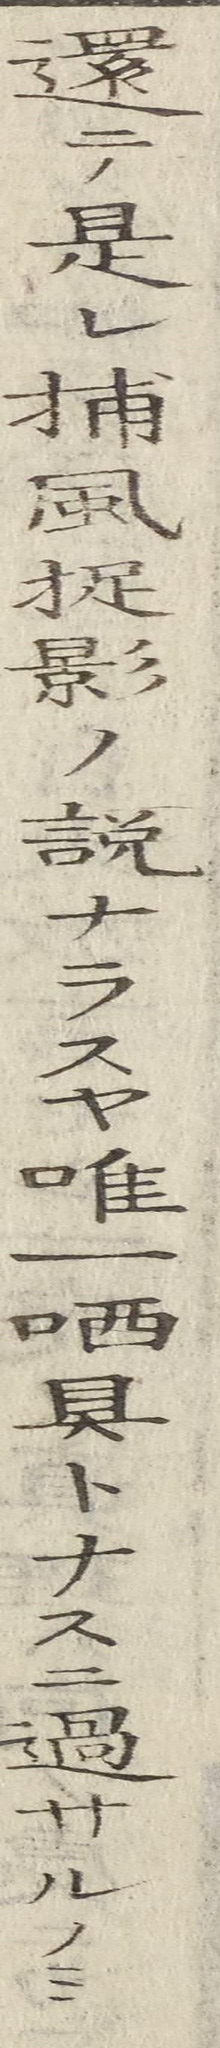還テ是レ捕風捉影ノ説ナラスヤ唯一哂具トナスニ過サルノミ
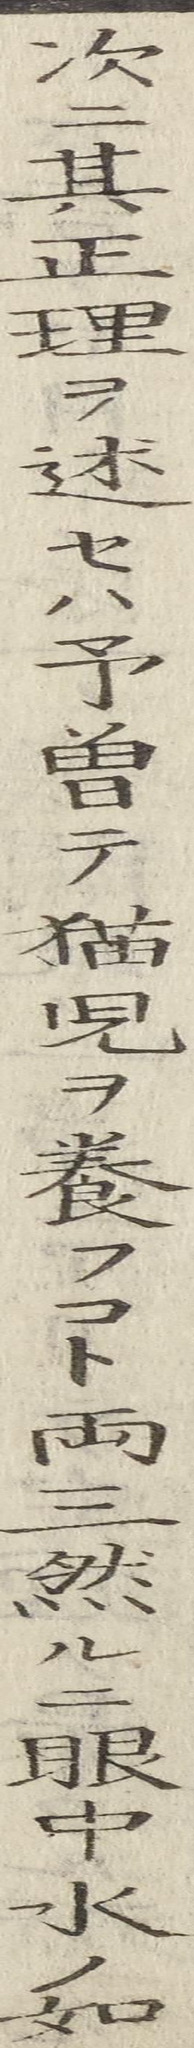次ニ其正理ヲ述セハ予曾テ猫児ヲ養フコト両三然ルニ眼中水ノ如
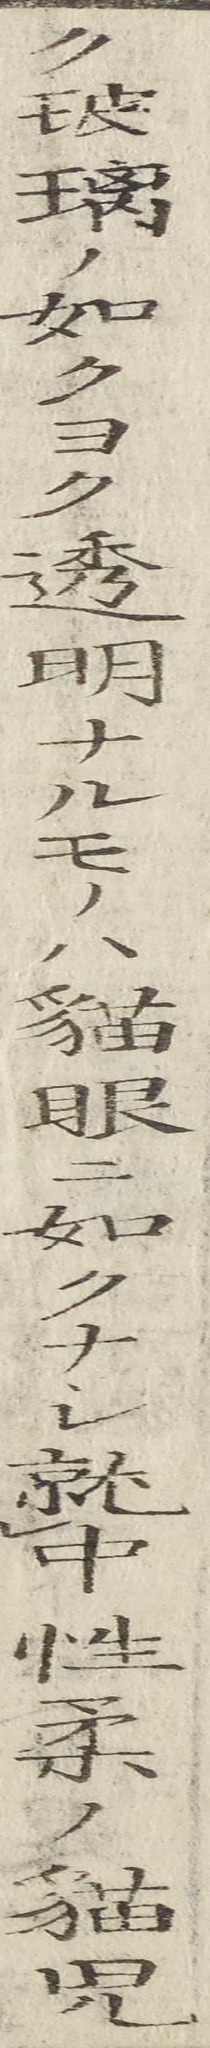ク玻璃ノ如クヨク透明ナルモノハ猫眼ニ如クナシ就中性柔ノ猫児
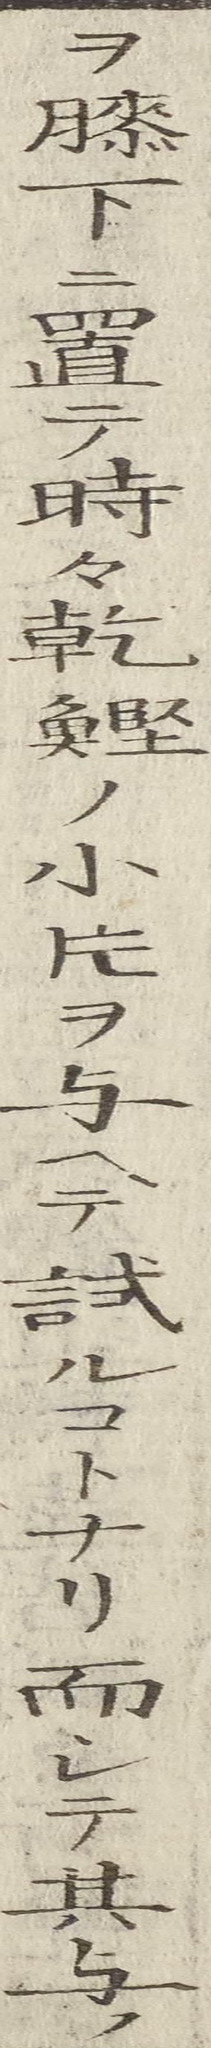ヲ膝下ニ置テ時々乾鰹ノ小片ヲ与ヘテ試ルコトナリ而シテ其与ノ
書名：護法新論　二編　下
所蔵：東京大学地震研究所図書室 Earthquake Research Institute Library, The University of Tokyo, JAPAN
